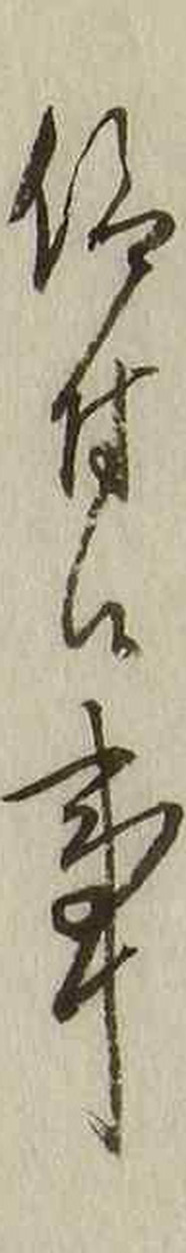仰付候事
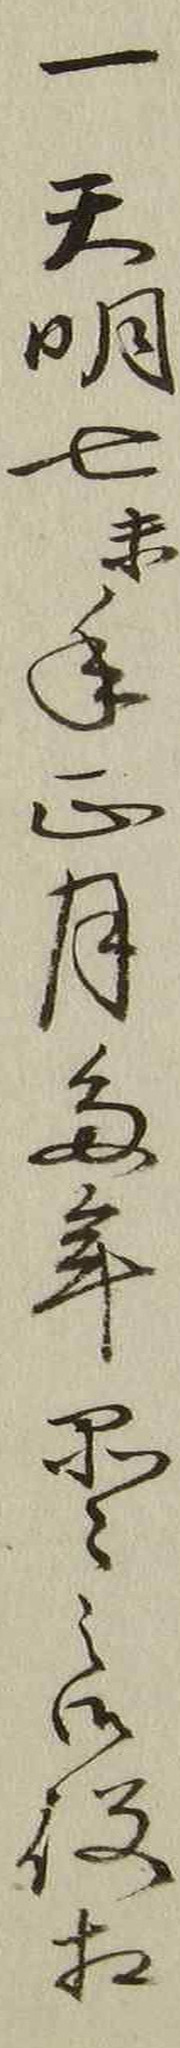一天明七未年正月多年品々之御役相
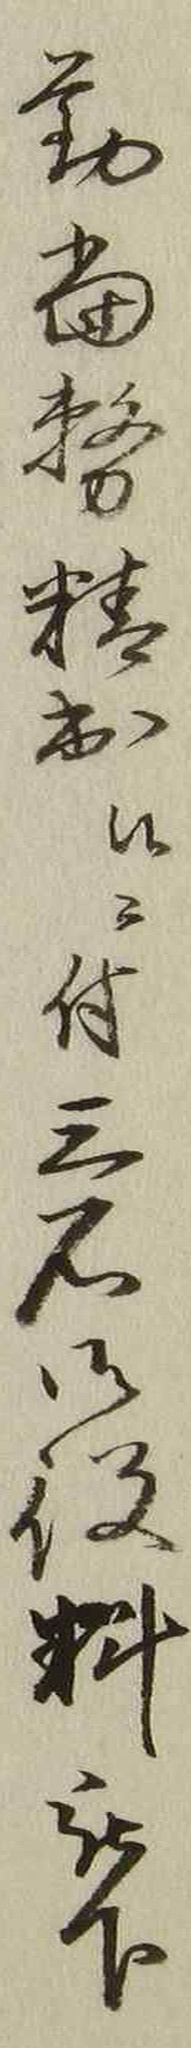勤当務精出候ニ付三石御役料被下
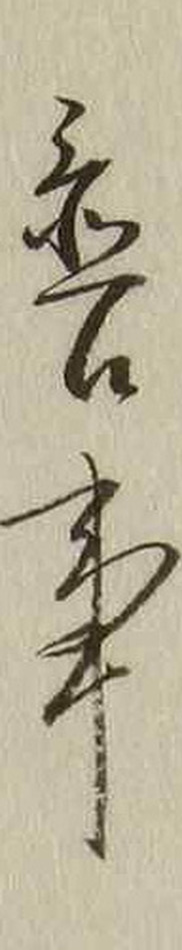置候事
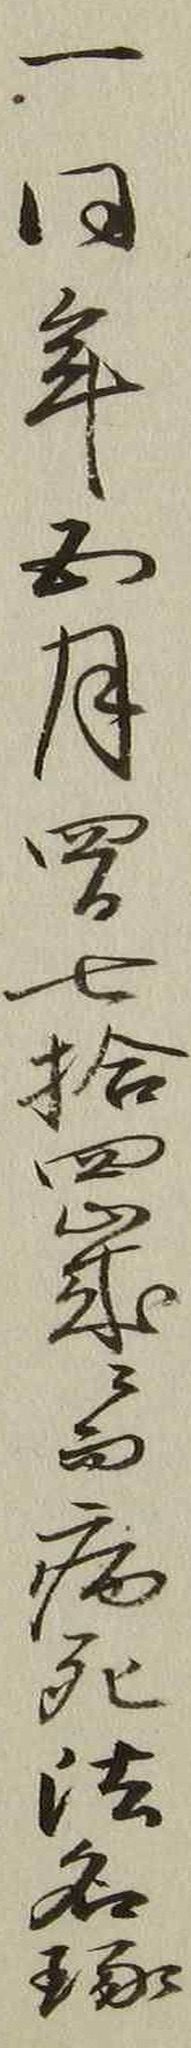一同年五月四日七拾四歳ニ而病死法名琢
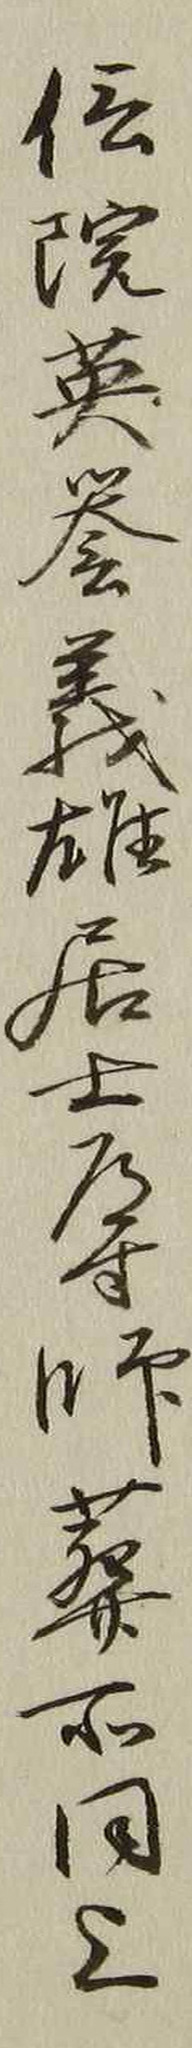信院英誉義雄居士導師葬所同上
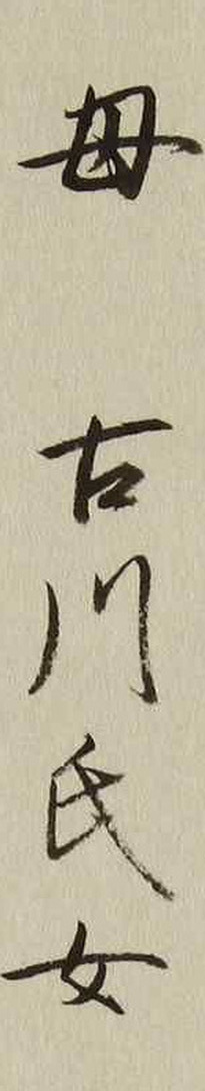母古川氏女
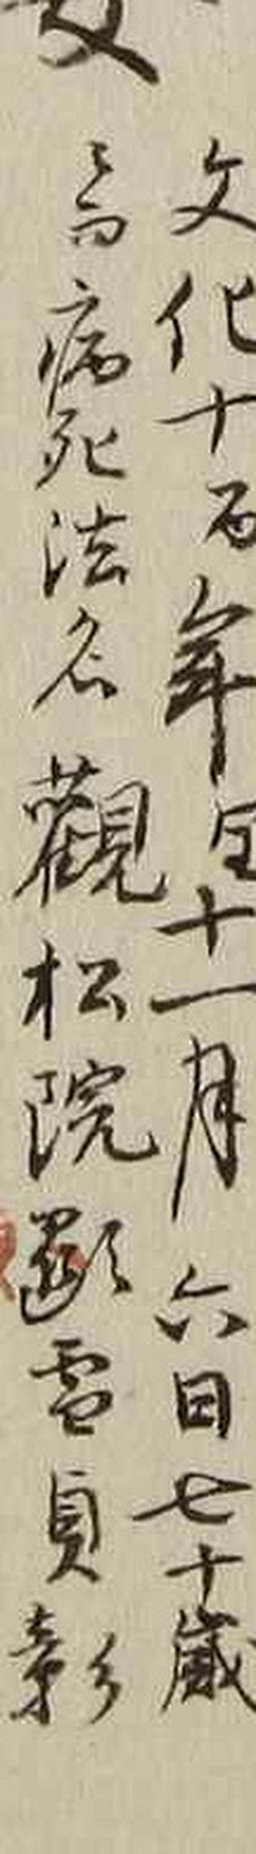ニ而病死法名觀松印顕雪貞影
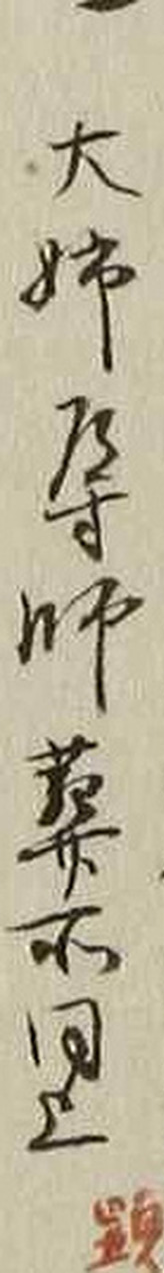大姉導師葬所同上
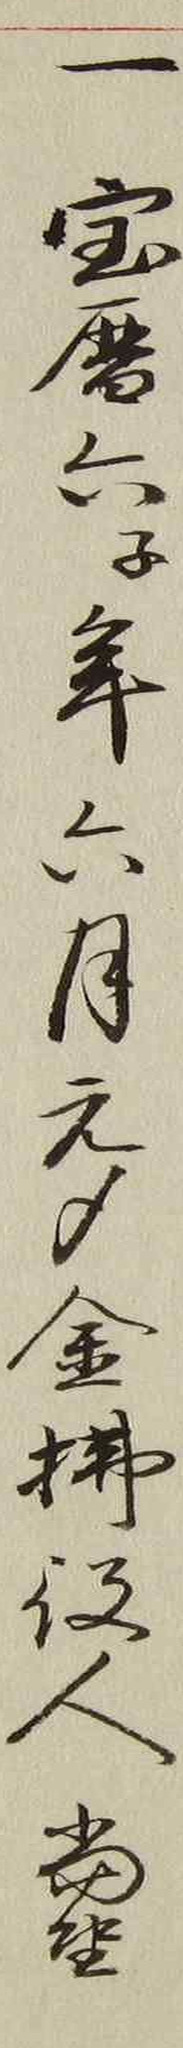一宝暦六子年六月元〆金払役人当坐
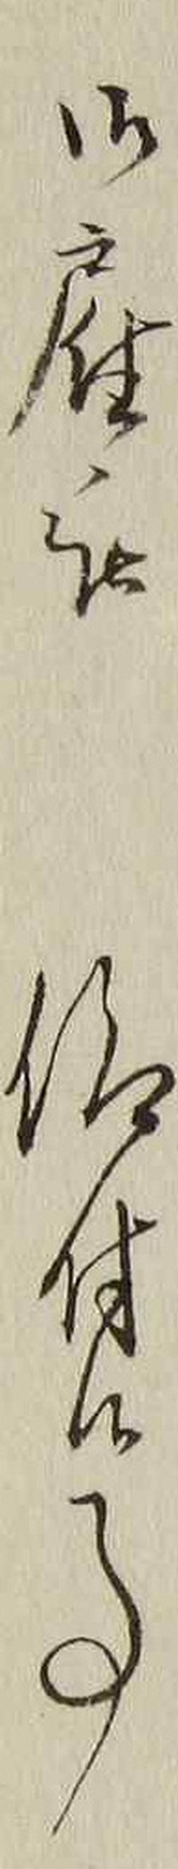御雇被仰付候事
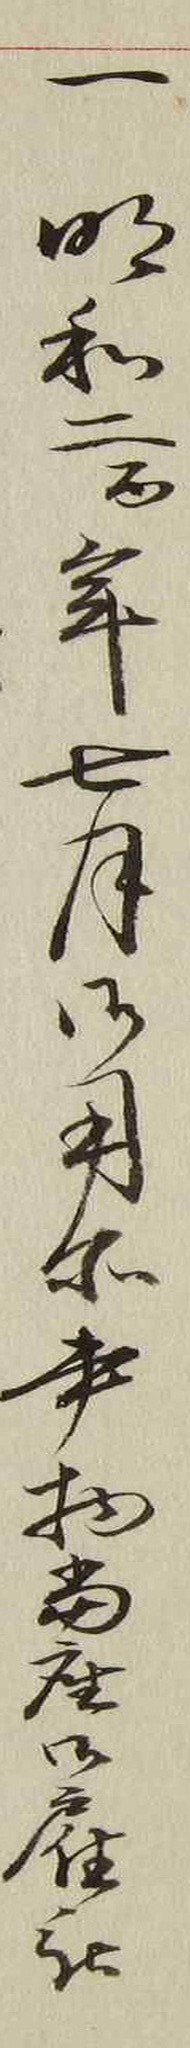一明和ニ酉年七月御用所書物当座御雇被
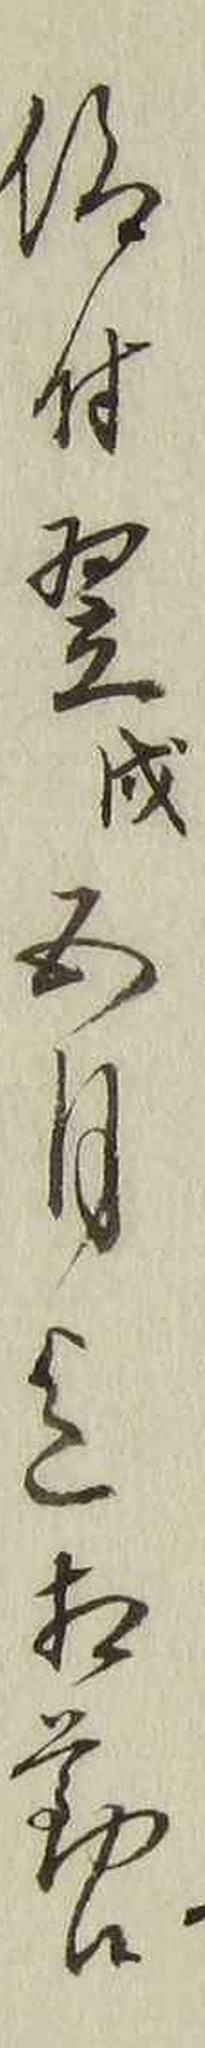仰付翌戌五月迄相勤候
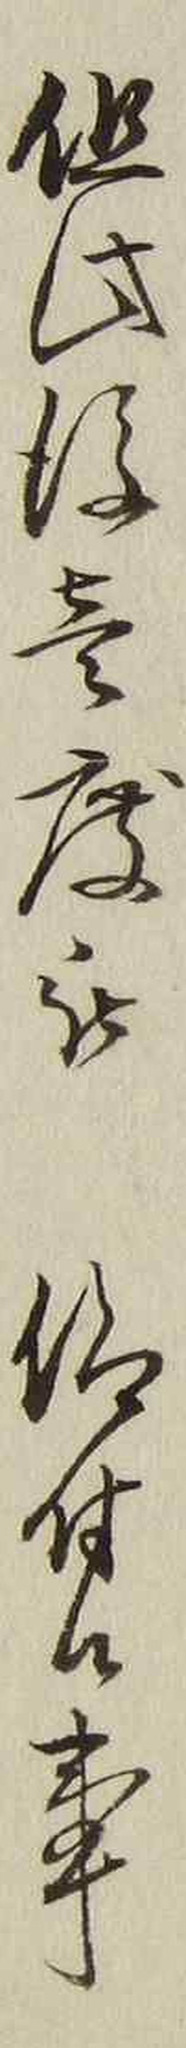但此後壱度被仰付候事
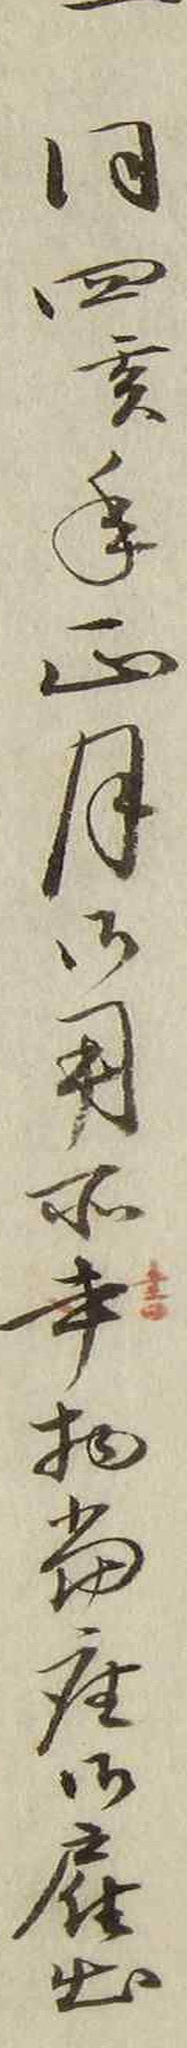一同四亥年正月御用所書物当座御雇出

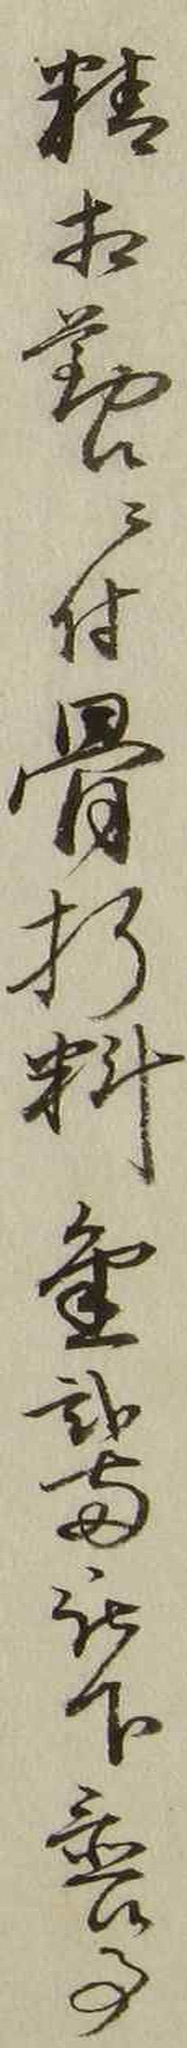精相勤候ニ付骨折料金弐両被下置候事
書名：諸士系譜　巻之114　か之部22
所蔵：会津若松市立会津図書館
